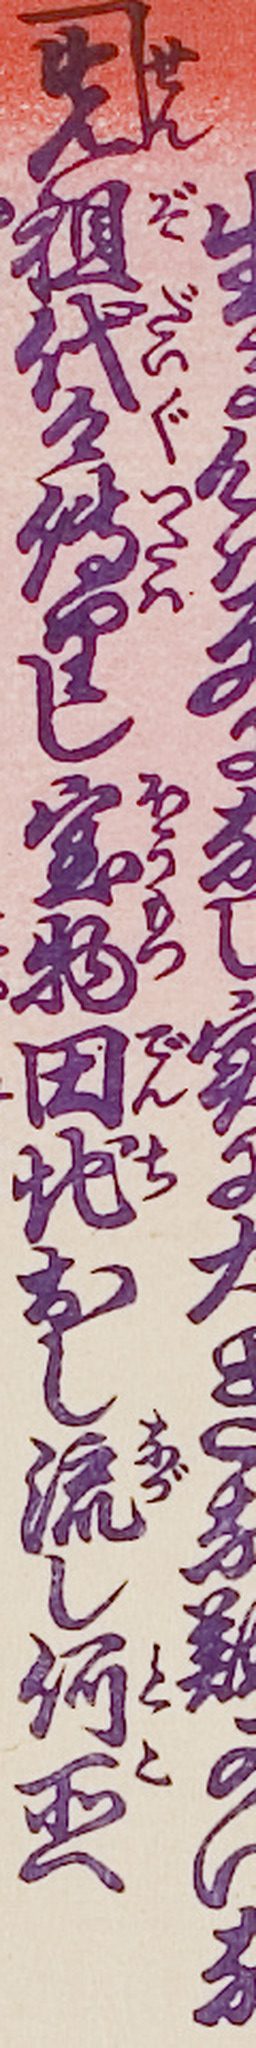〽先祖代々伝りし宝物田地おし流し何所へ
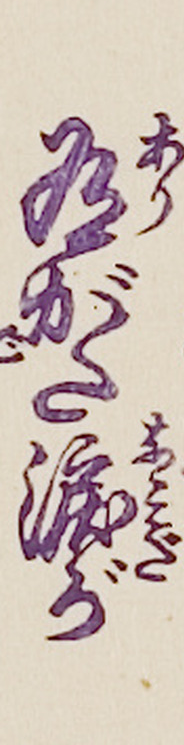有がた涙が
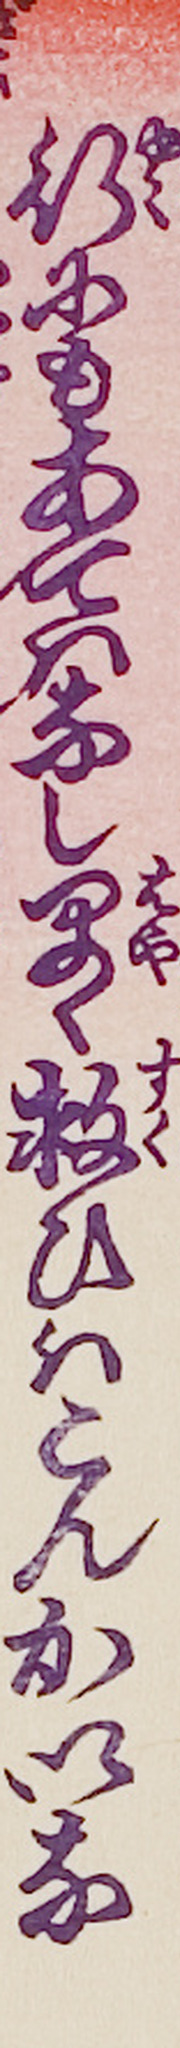行にもあてはなし早く救ひはこんかいな
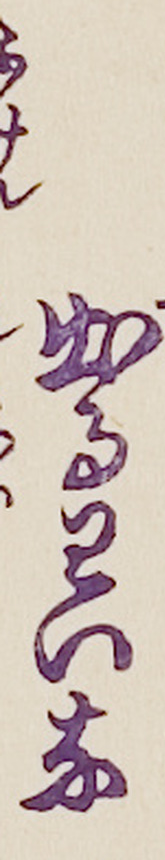出るわいな
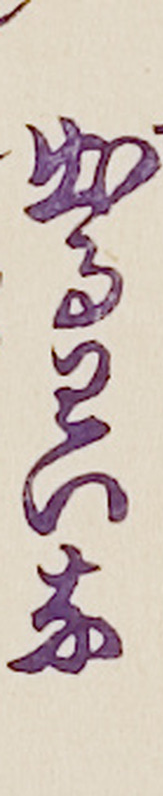出るわいな
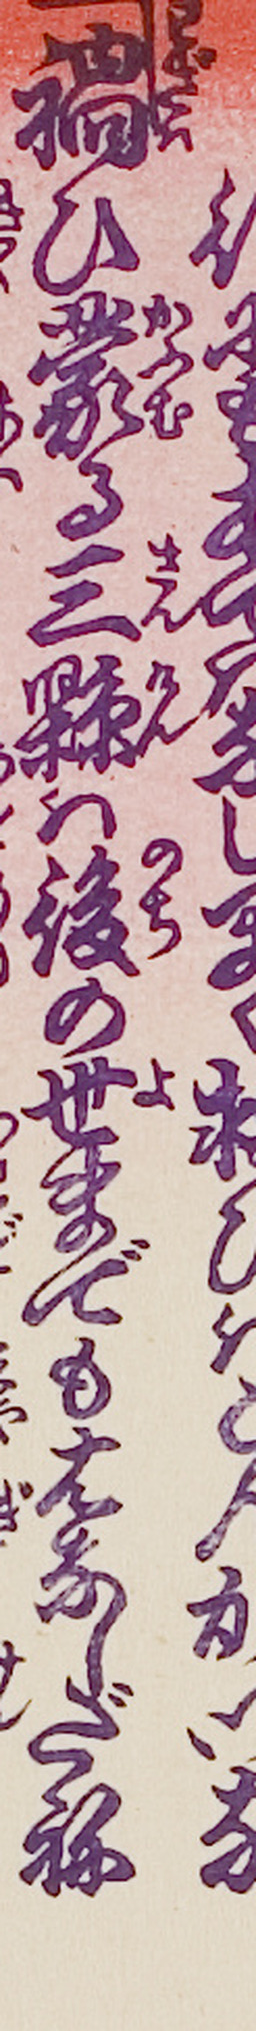〽禍ひ蒙る三県は後の世までもはなしだね
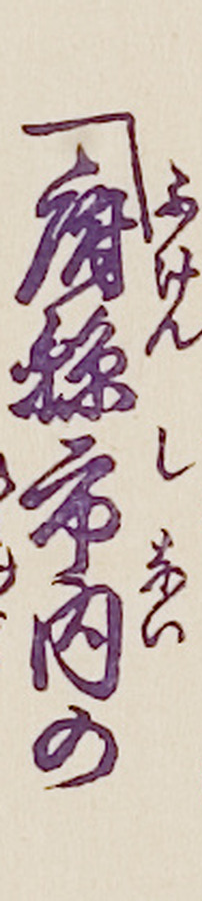〽府県市内の
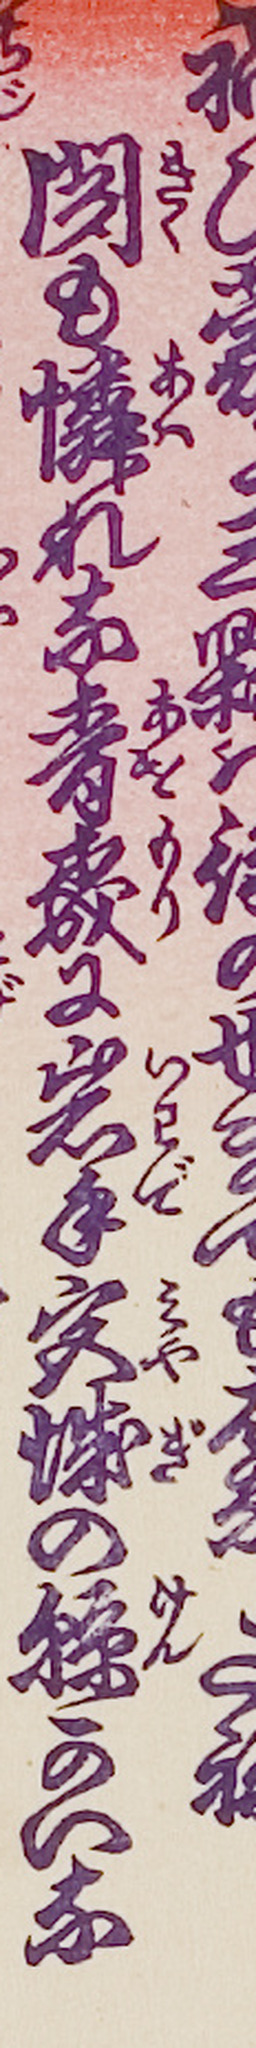聞も憐れな青森に岩手宮城の県かいな
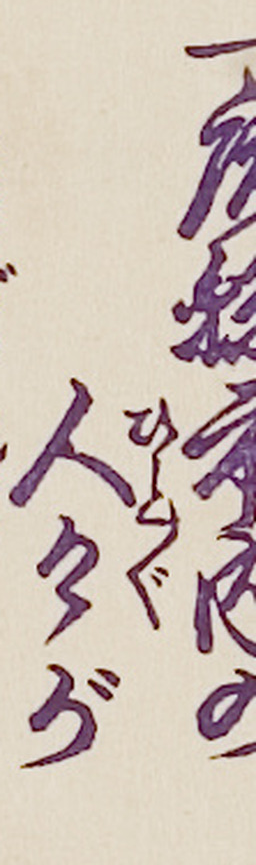人々が
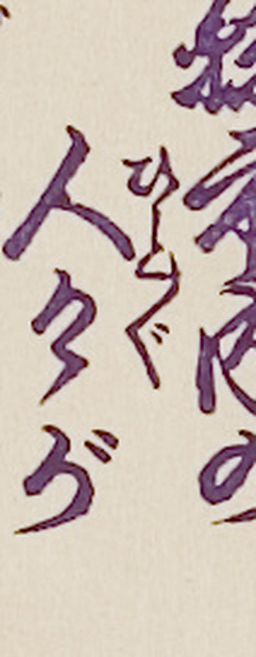人々が
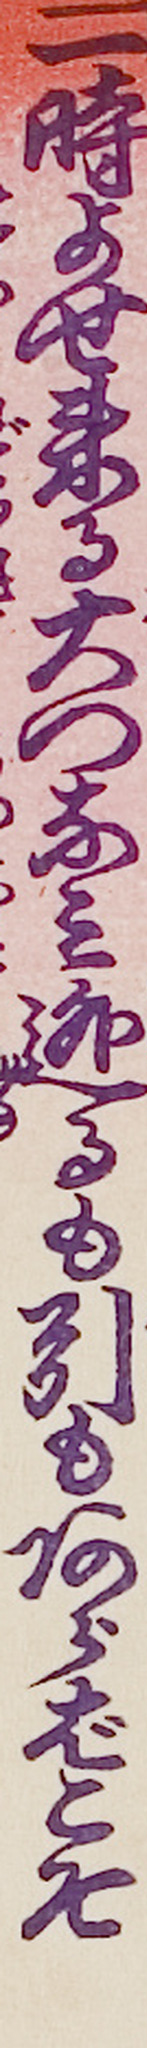〽一時よせ来る大つなみ逃るも引もあらばこそ
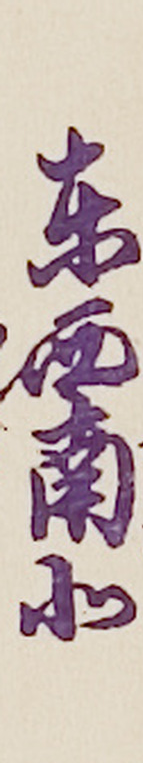東西南北
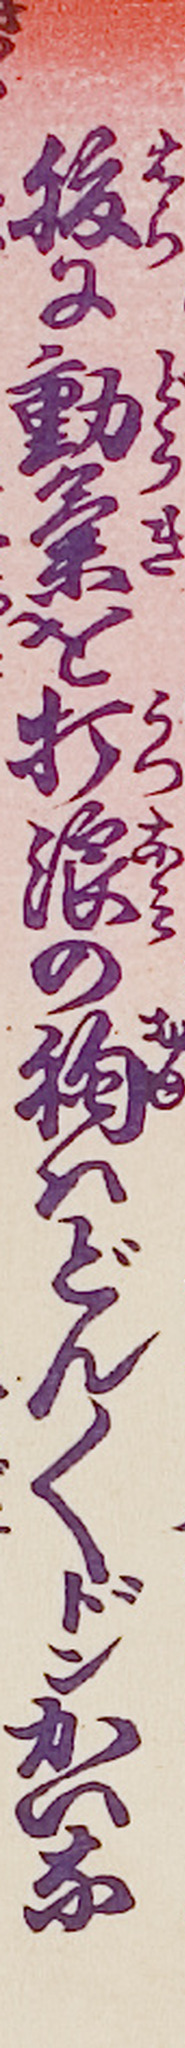腹に動気を打浪の胸はどん〳〵ドンかいな
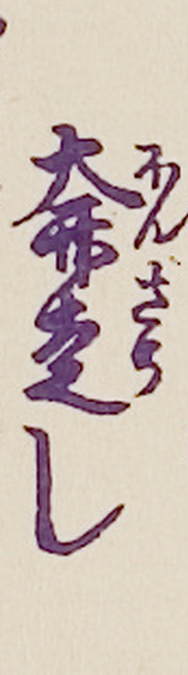奔走し
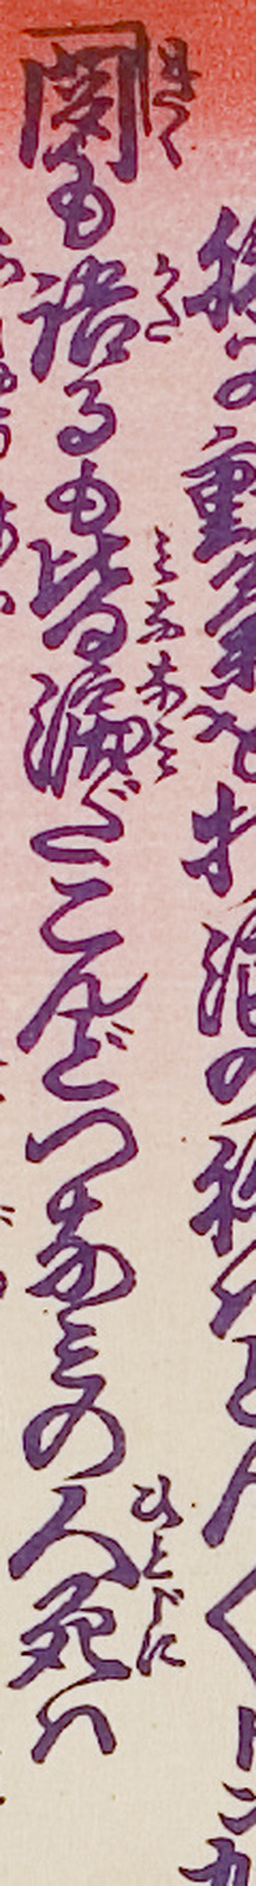〽聞も語るも皆涙だこんどつなみの人死は
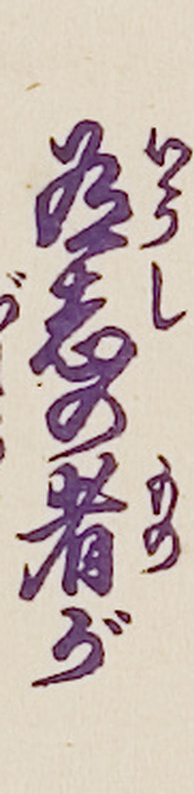有志の者が
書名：北陸三県大つなみ縁かいな節
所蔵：東京大学総合図書館 General Library in the University of Tokyo, JAPAN
